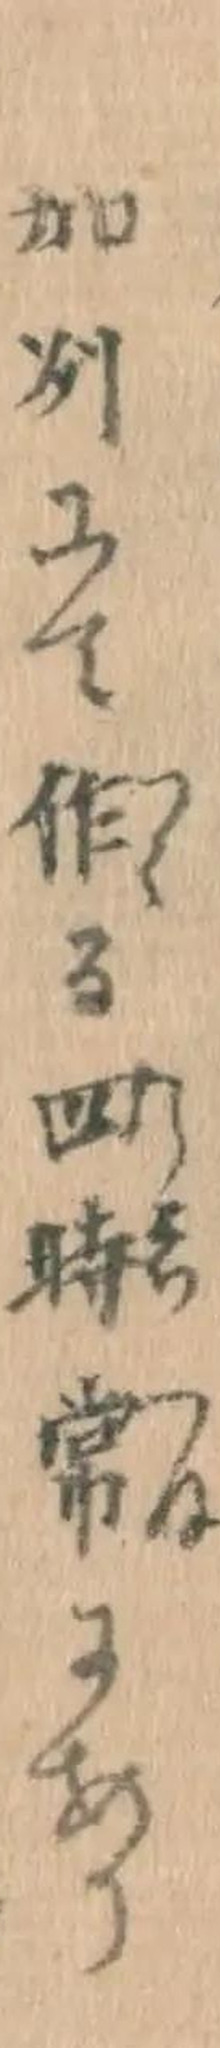加州にて作る四時常にあり
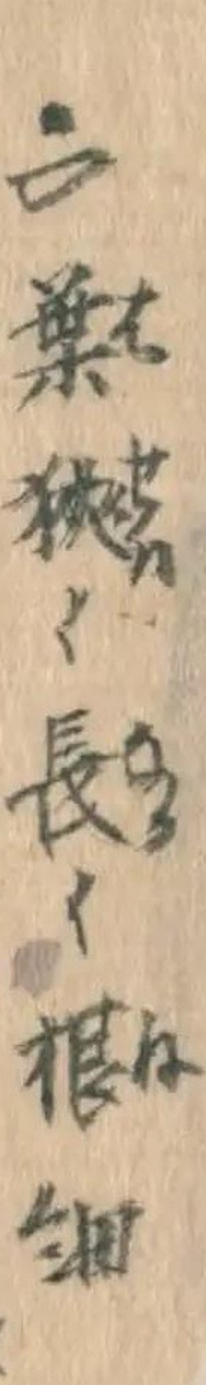・▻葉狭く長く根細
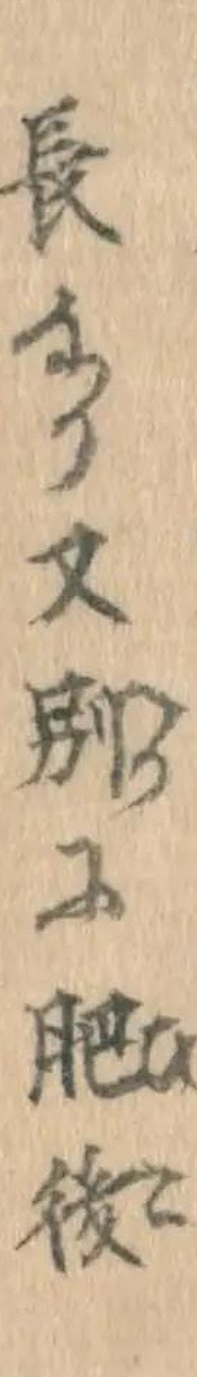長なり又別に肥後
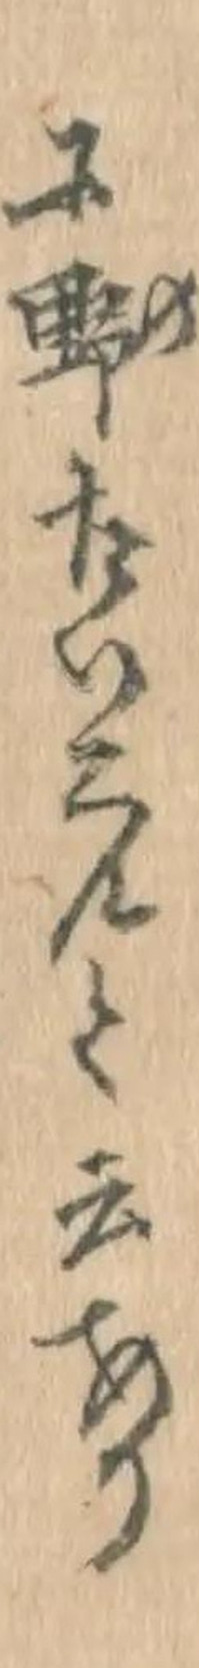に野たいこんと云あり
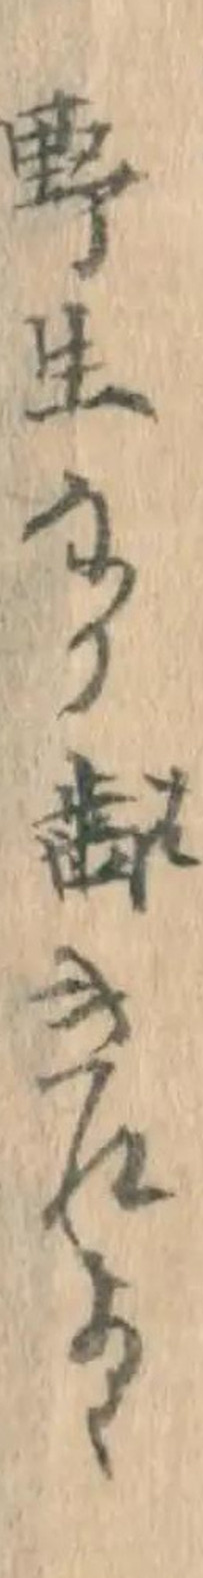野生なり歯きれよく
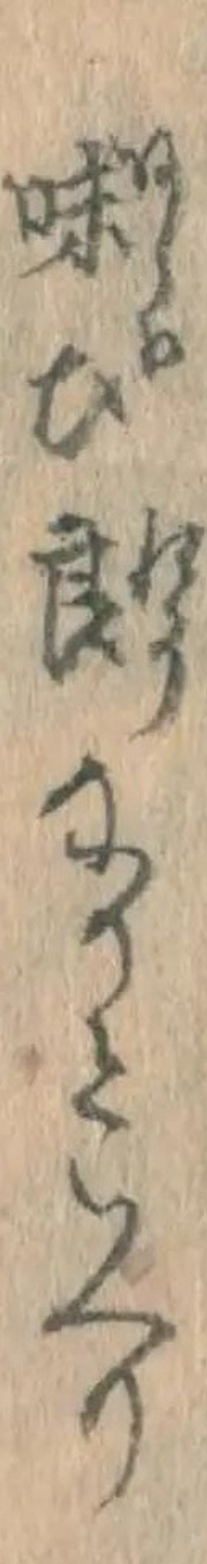味ひ良なりといへり

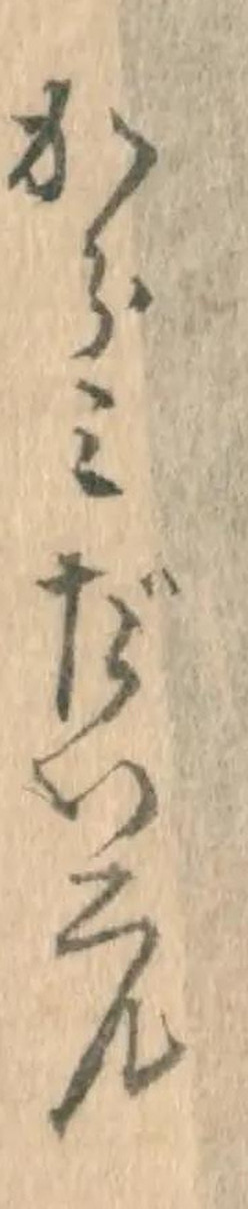からみだいこん
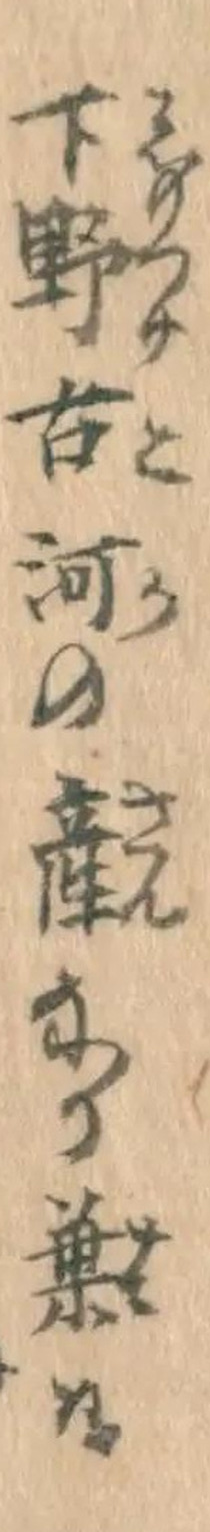下野古河の産なり葉は
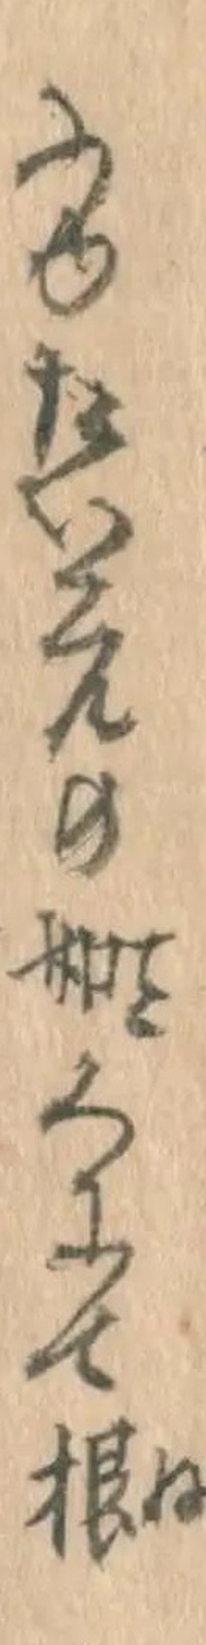ふゆたいこんの如くにて根
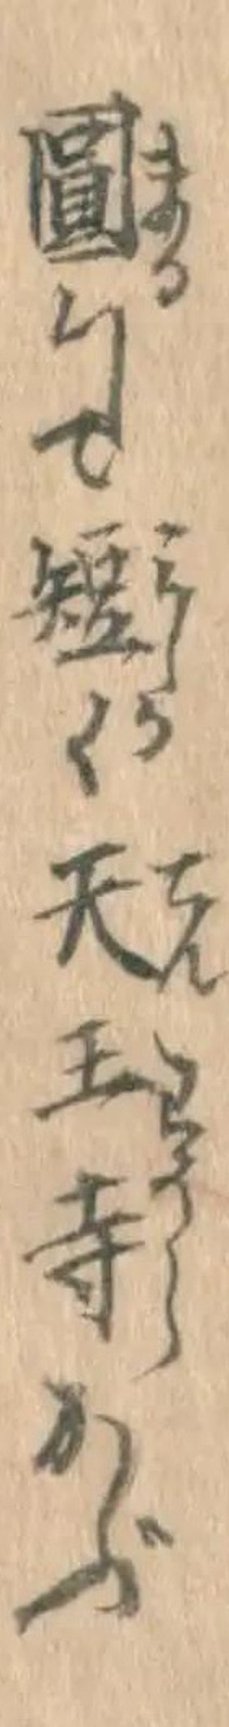円くして短く天王寺かぶ
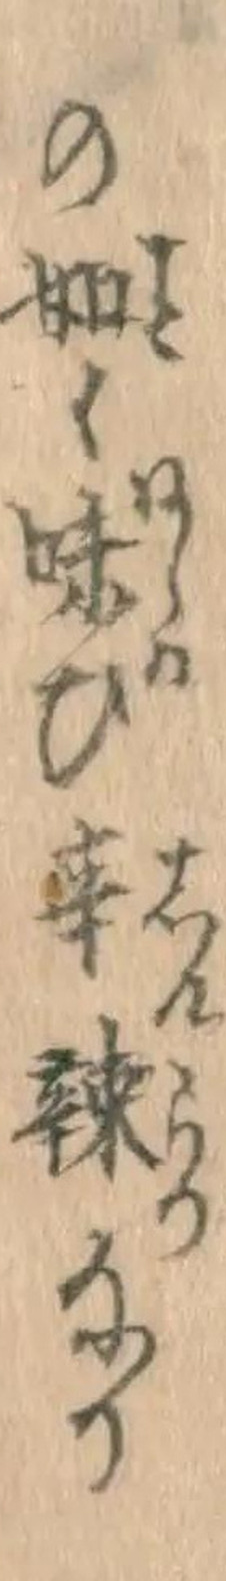の如く味ひ辛辣なり

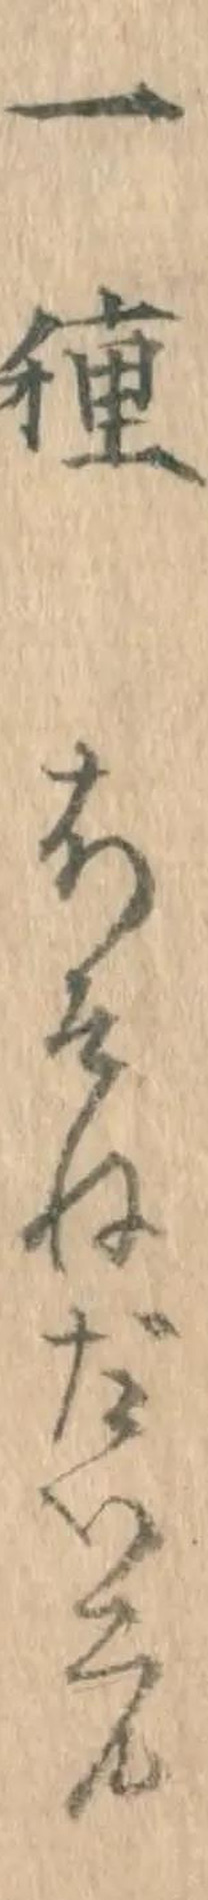一種ほそねだいこん
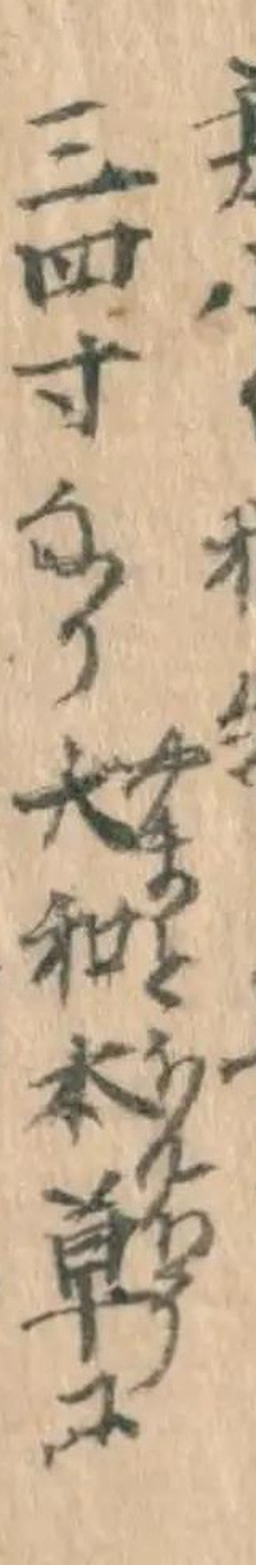三四寸なり大和本草に
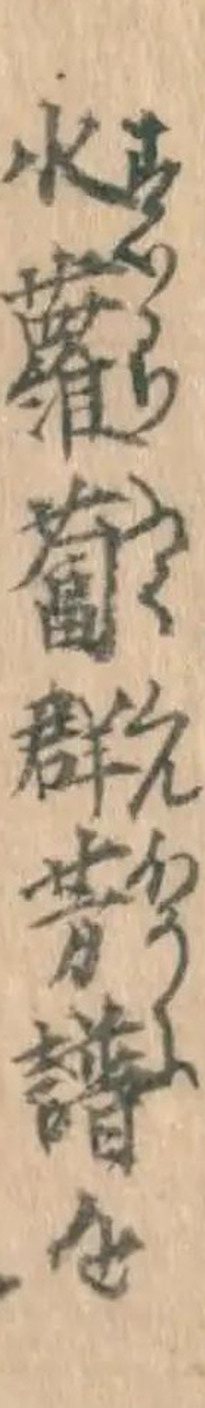水蘿蔔群芳譜を
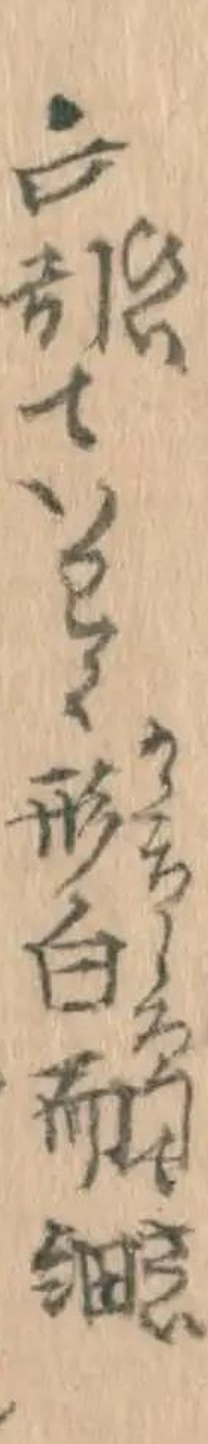・▻引ていわく形白而細
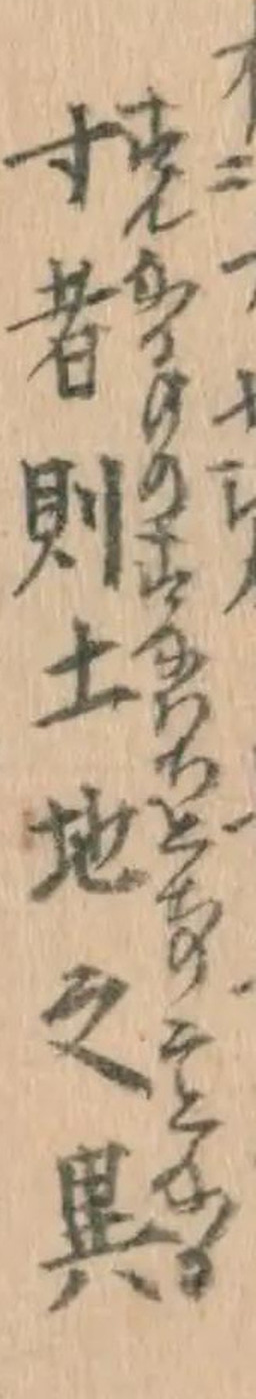寸者則土地之異
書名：本草図譜. 巻46-48
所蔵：国立国会図書館 National Diet Library, JAPAN
